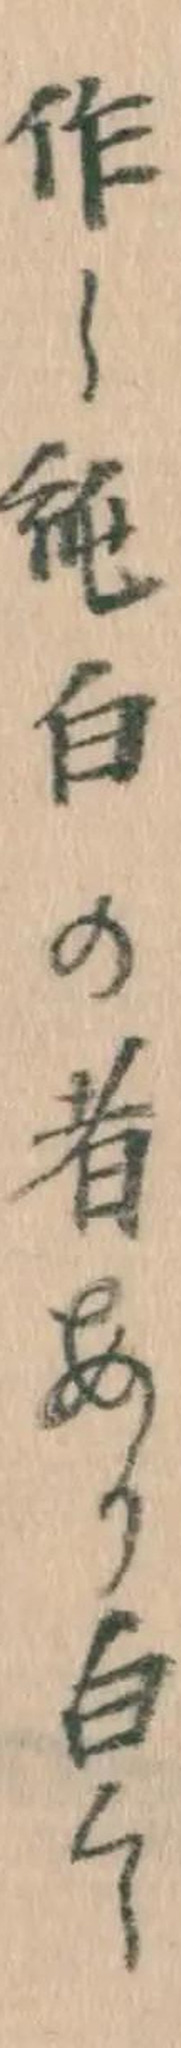作し純白の者あり白くし
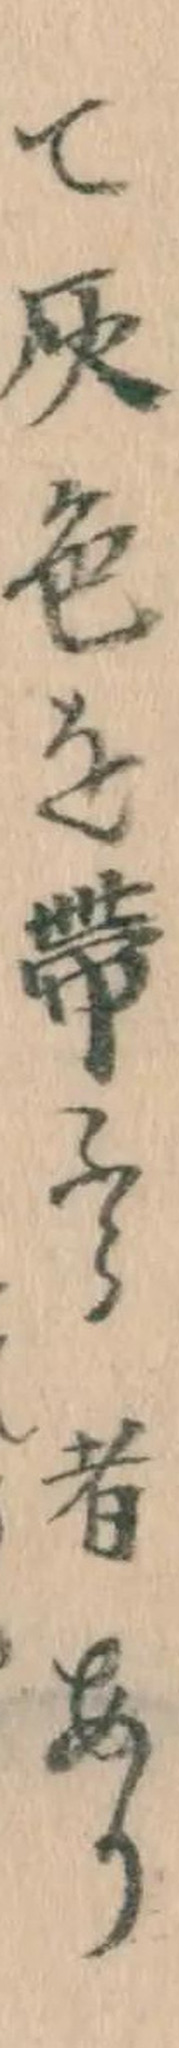て灰色を帯ふる者あり
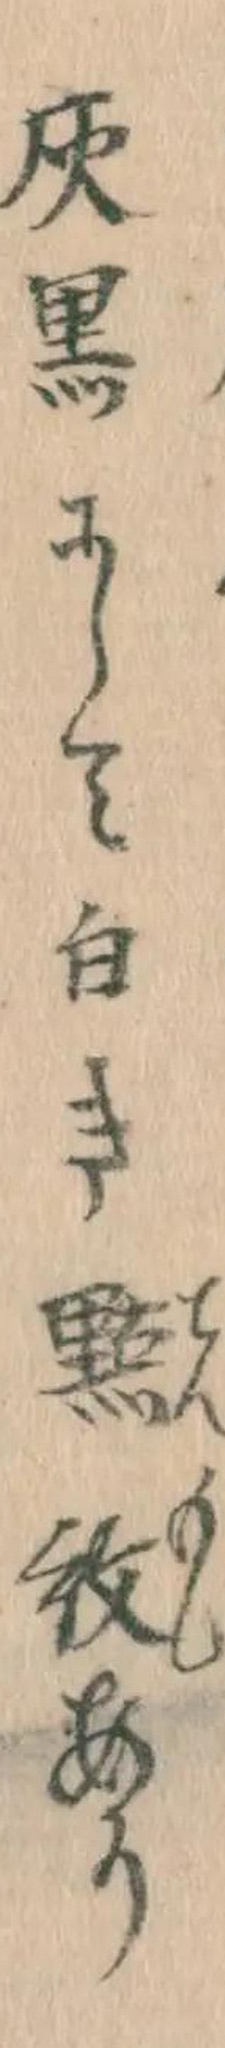灰黒にして白き点紋あり
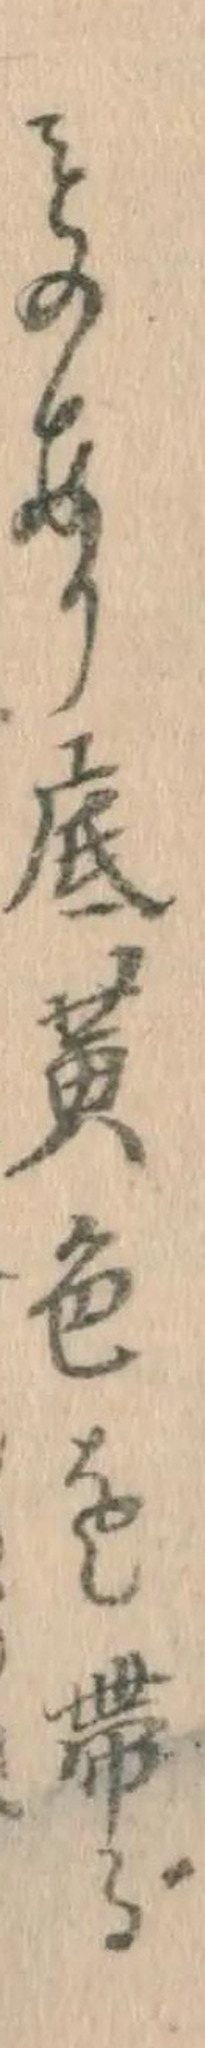ものあり底黄色を帯る
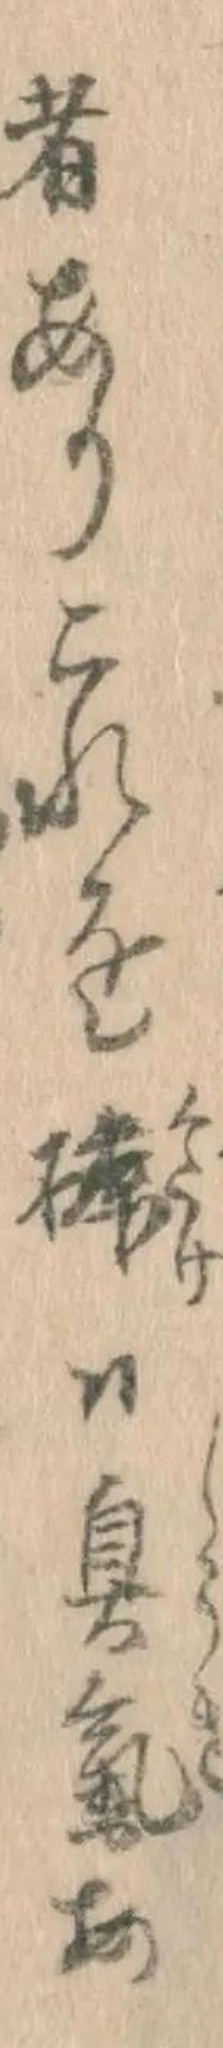者ありこれを砕は臭気あ
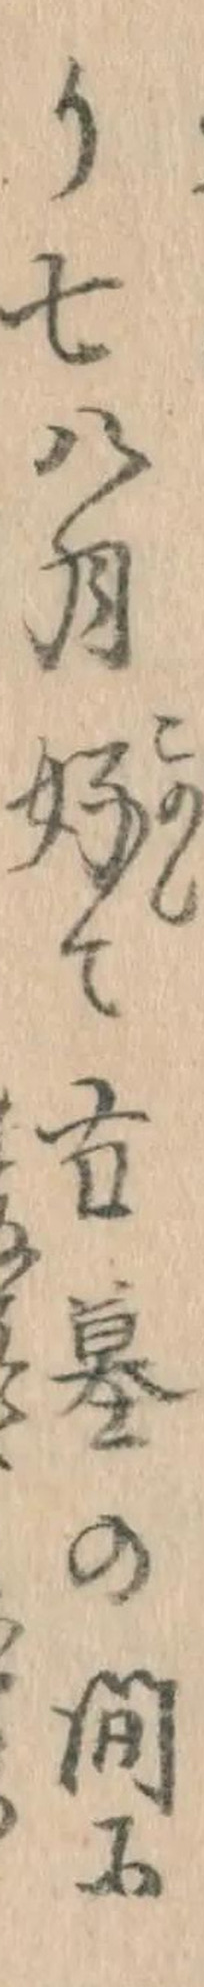り七八月好て古墓の間に
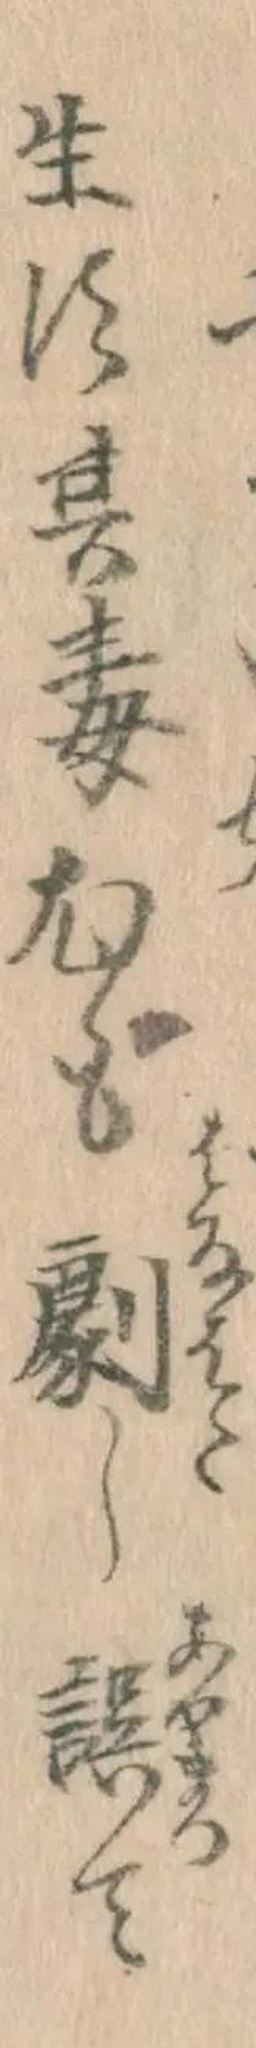生す其毒尤も劇し誤て
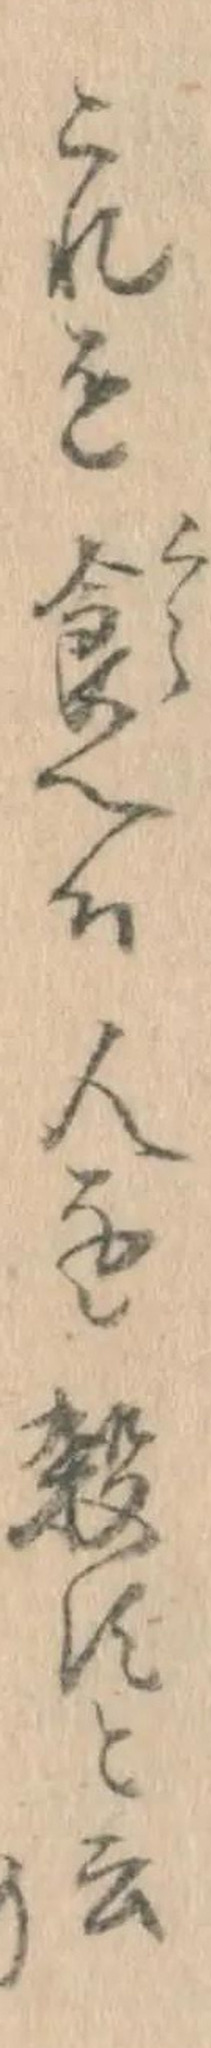これを食へは人を殺すと云り

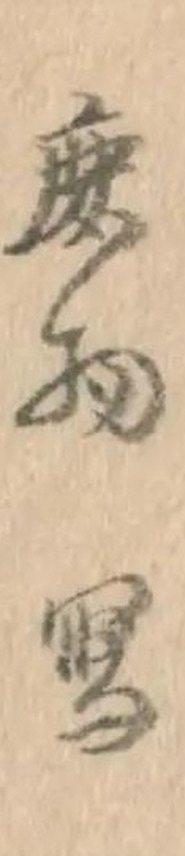庶物写
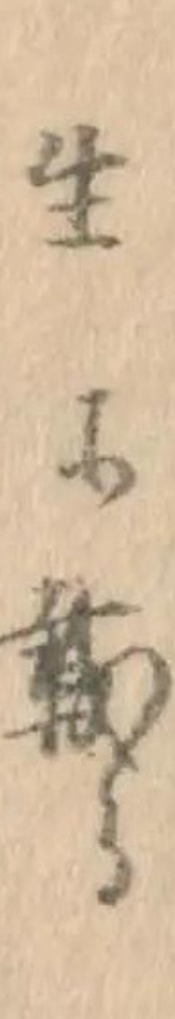生に載る
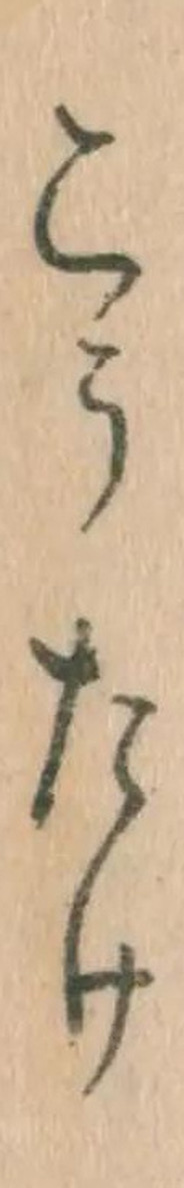こうたけ
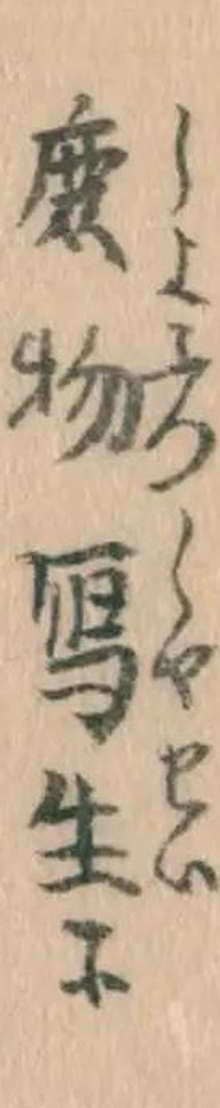庶物写生に
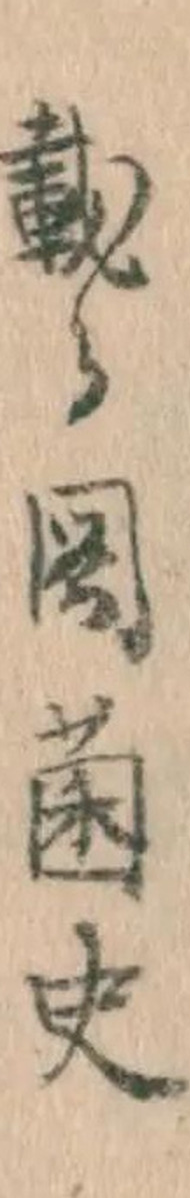載る図菌史
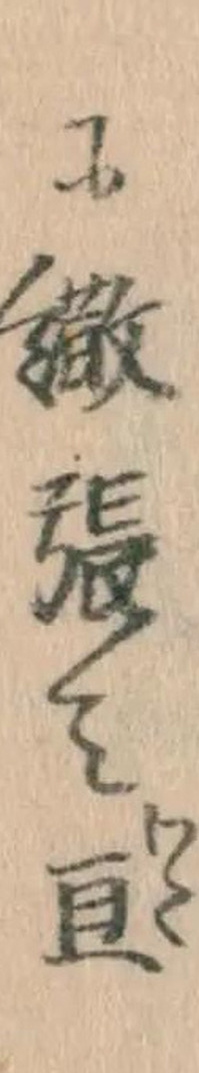に繖張て亘
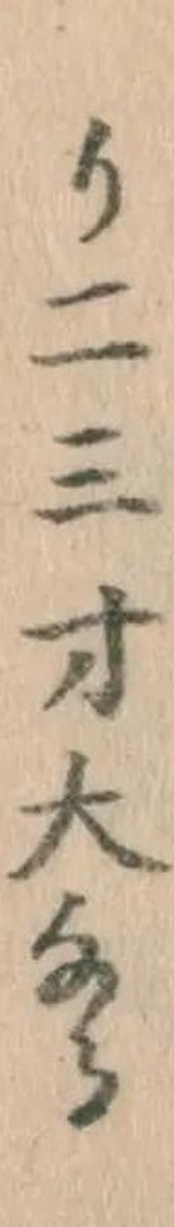り二三寸大なる
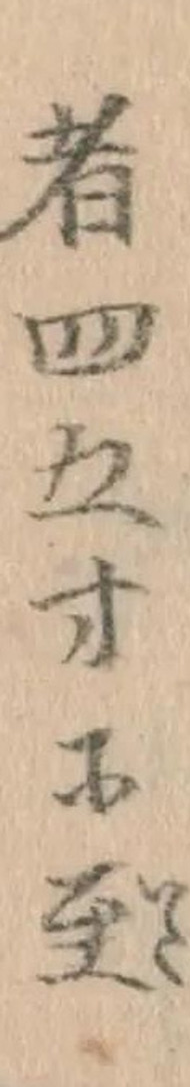者四五寸に至
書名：本草図譜. 巻58-60
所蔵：国立国会図書館 National Diet Library, JAPAN
